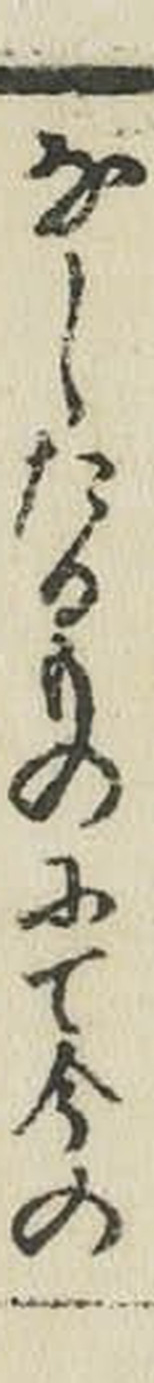なしたるものにて今の
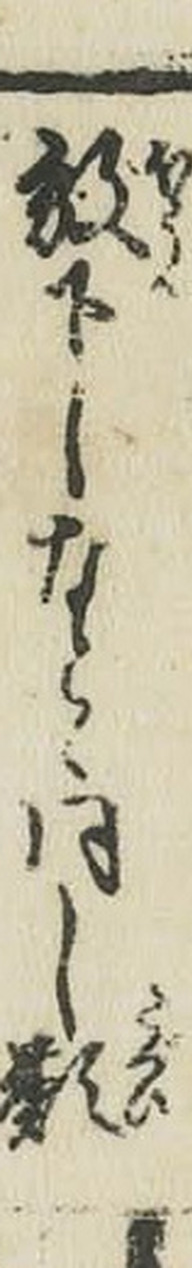放下しなとゝ同し類
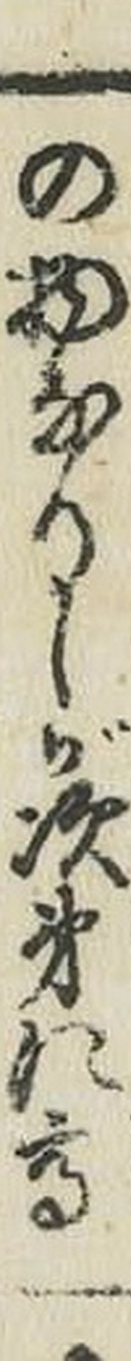の物なりしが次第に高
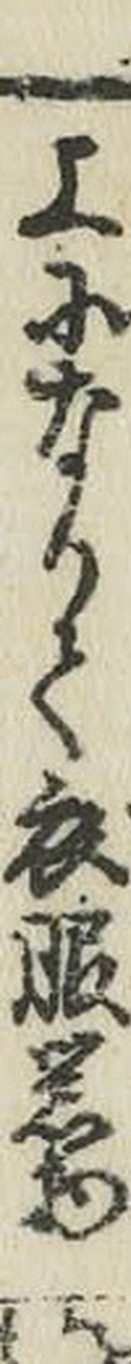上になりて衣服器物
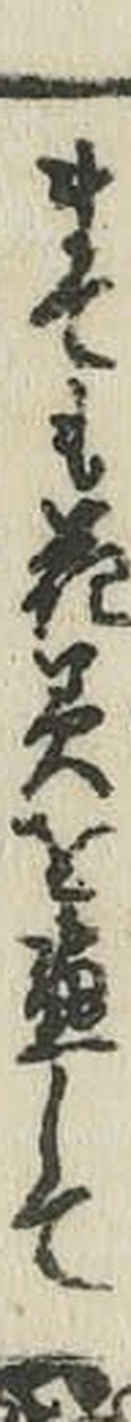まても花美を尽して
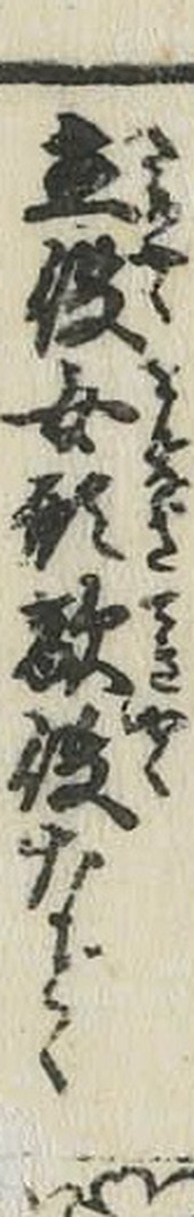立役女形敵役などゝ
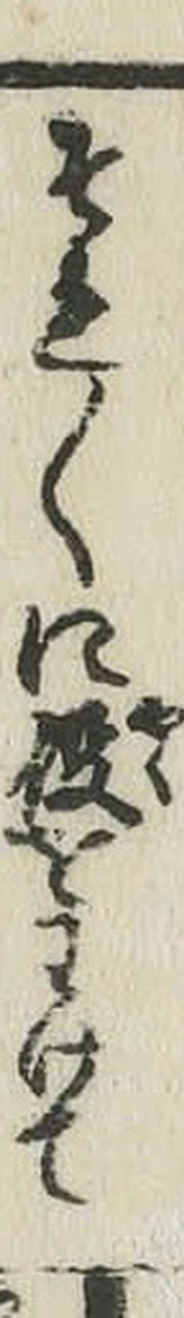それ〳〵に役をわけて
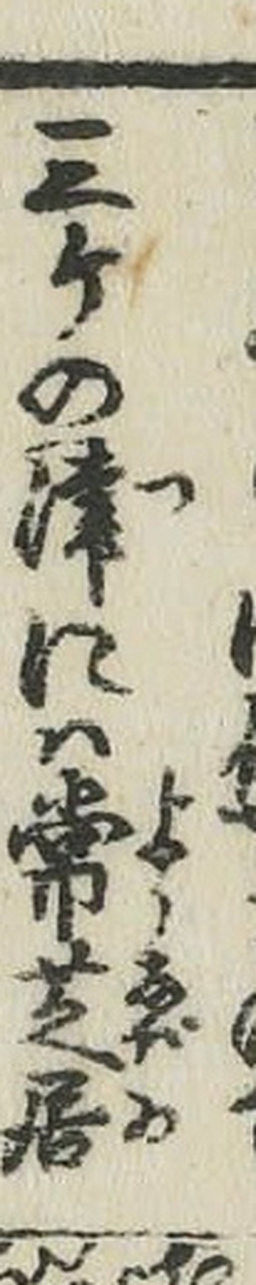三ケの津には常芝居
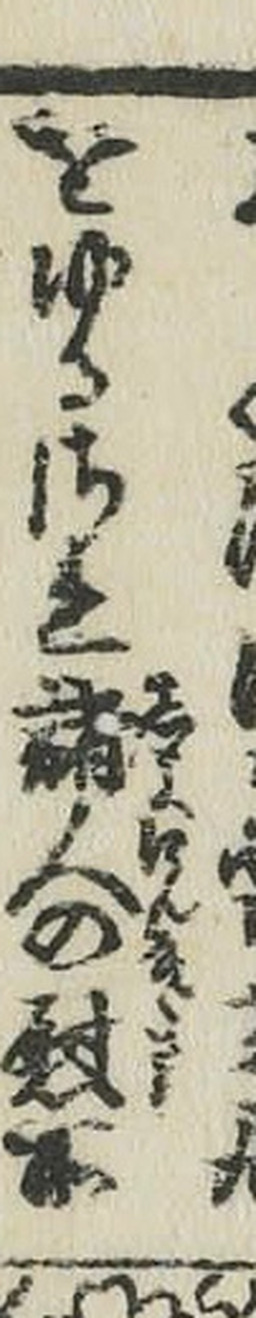をゆるされ諸人の慰所
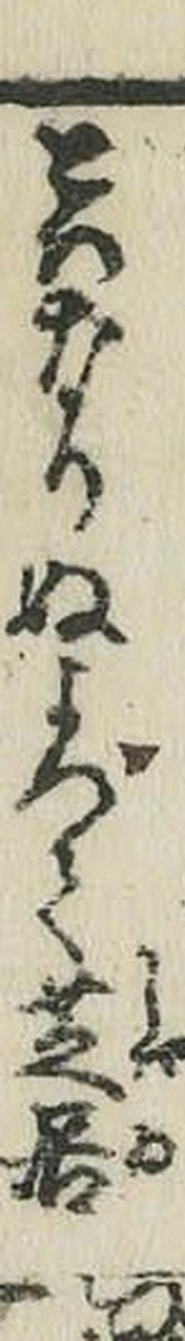とはなりぬよつて芝居
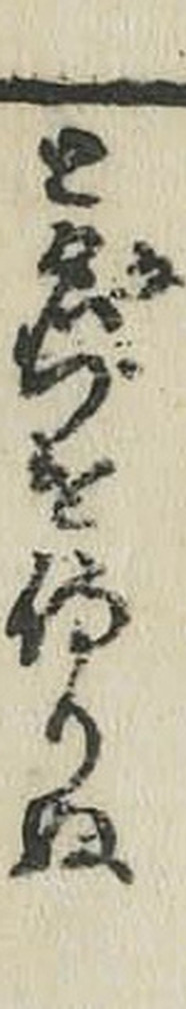と名づけ侍りぬ

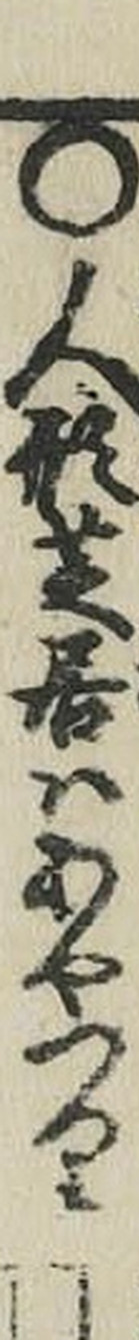○人形芝居はあやつり
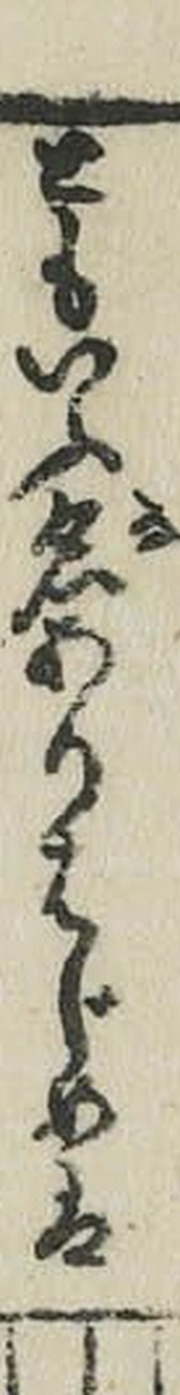ともいふ名ありはじめは
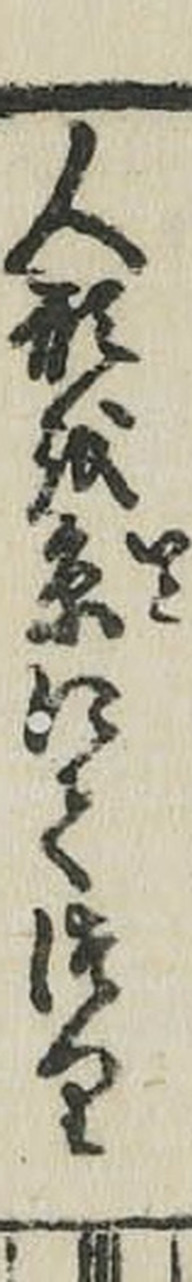人形を糸にてつり
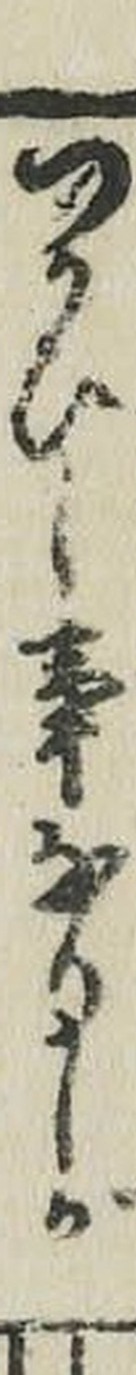つかひし事なりしが
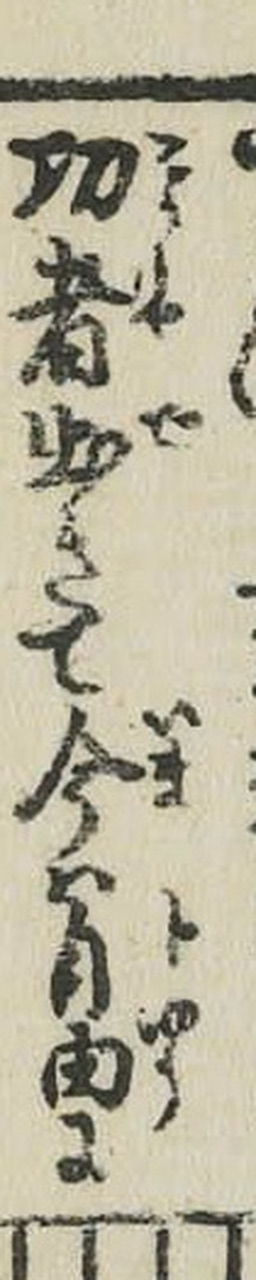巧者出きて今は自由に
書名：増補頭書訓蒙図彙大成 10巻 10:巻之21
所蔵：東京学芸大学教育コンテンツアーカイブ
